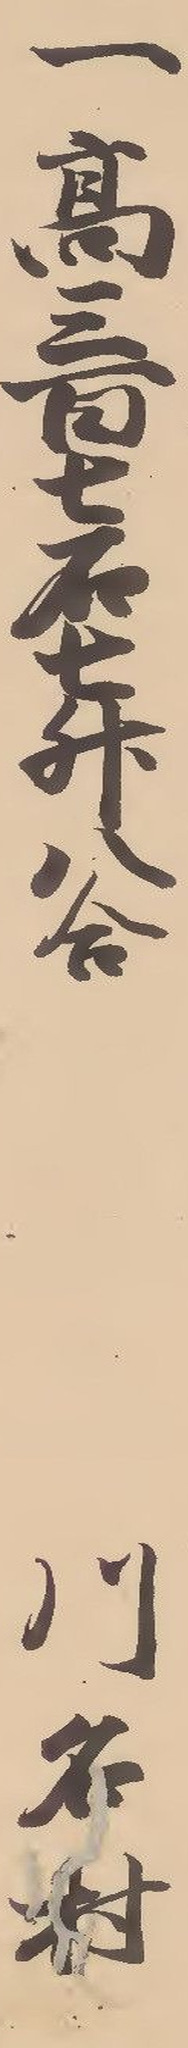一高三百七石七升八合川名村
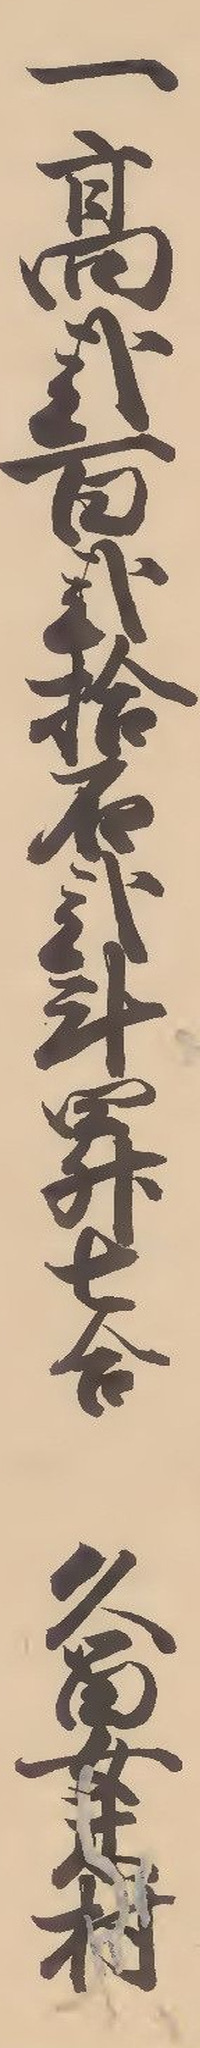一高弐百弐拾石弐斗四升七合久留女木村
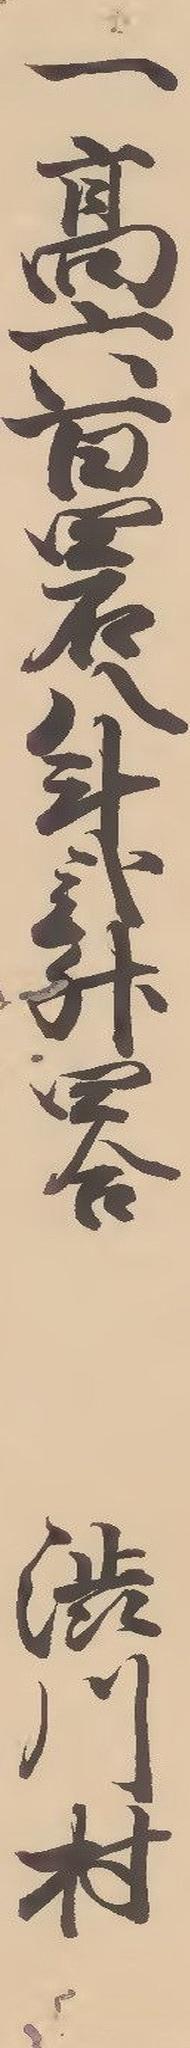一高六百四石八斗弐升四合渋川村
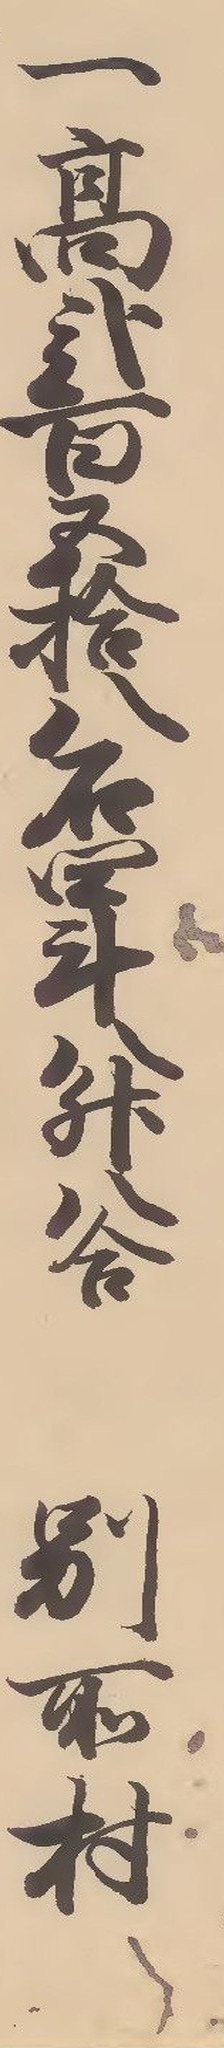一高弐百五拾八石四斗八升八合別所村
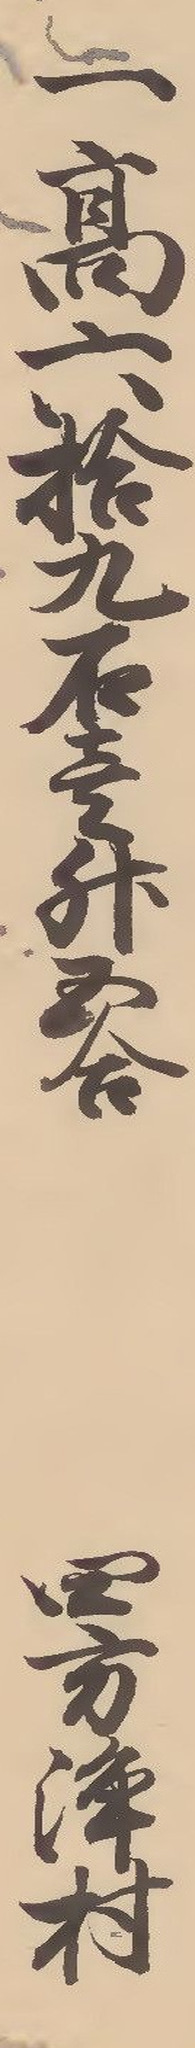一高六拾九石壱升五合四方浄村

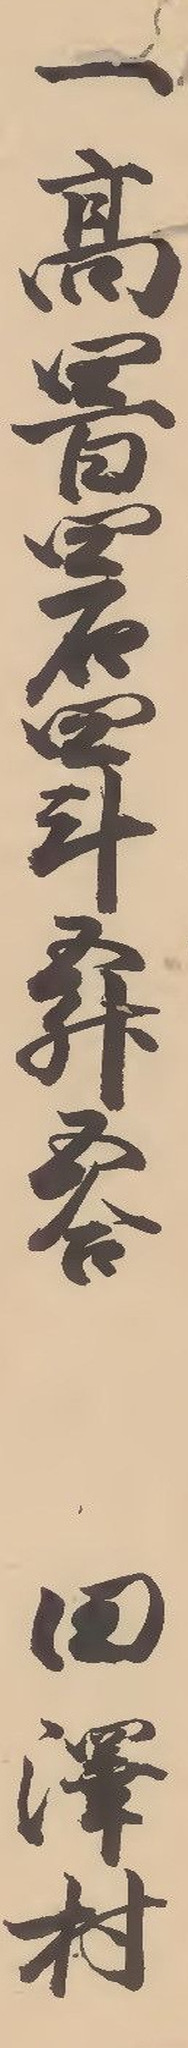一高四百四石四斗五升五合田沢村
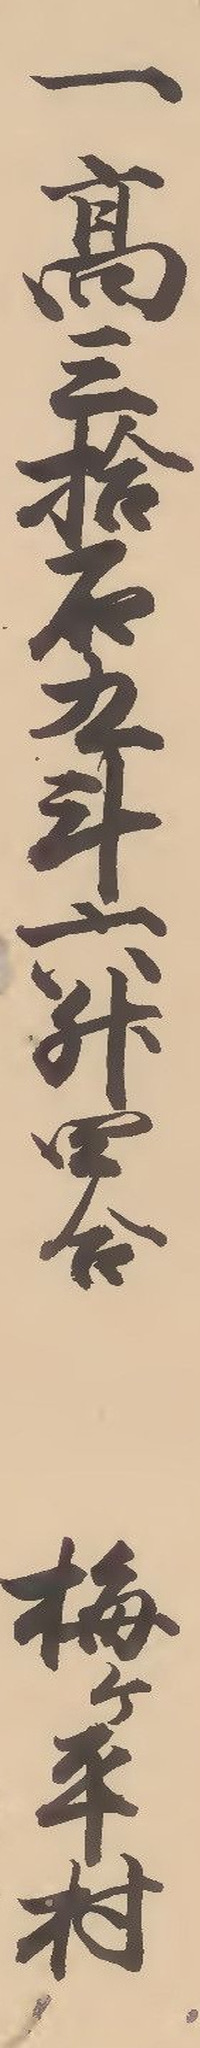一高三拾石九斗六升四合梅ヶ平村
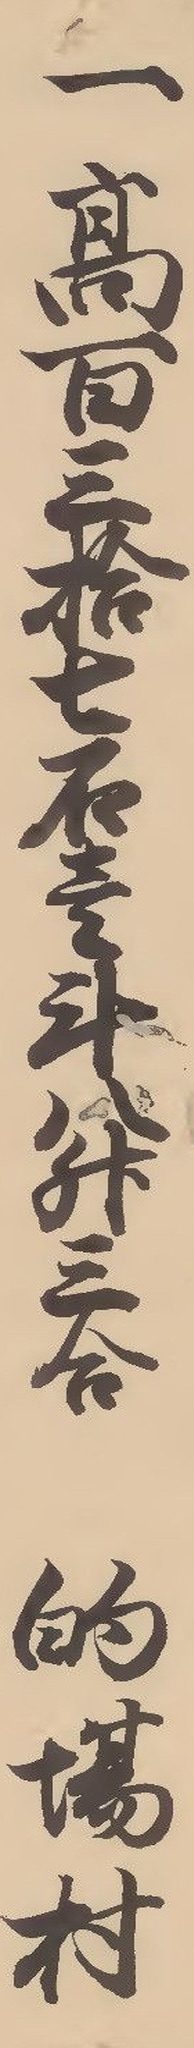一高百三拾七石壱斗八升三合的場村
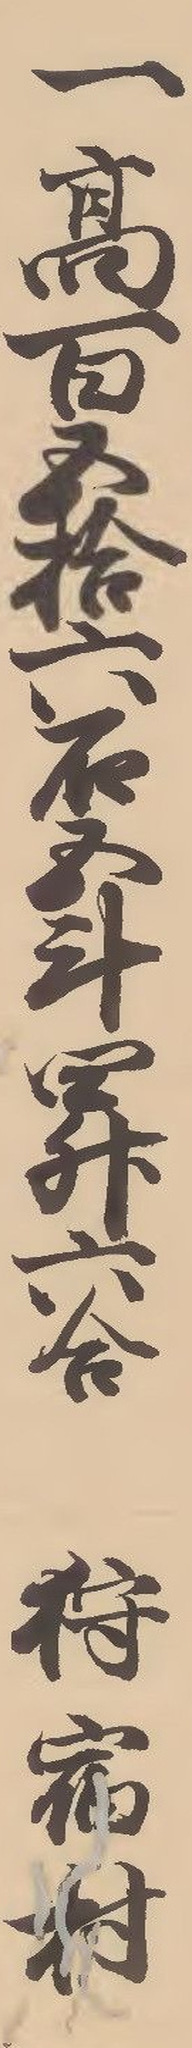一高百五拾六石五斗四升六合狩宿付
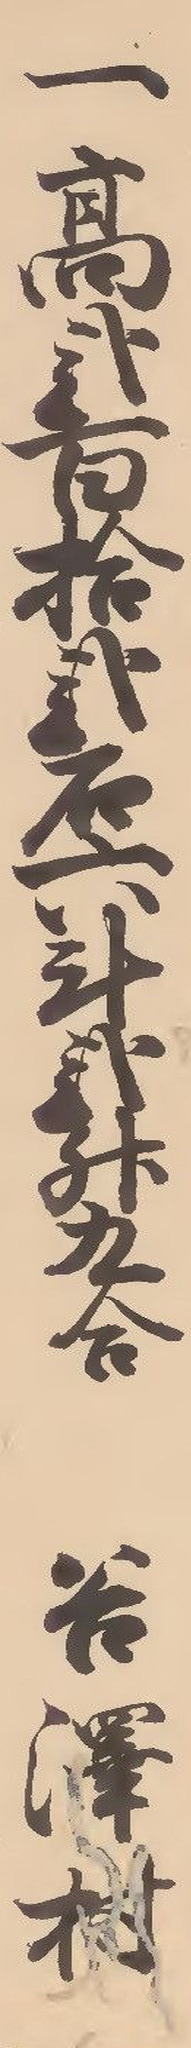一高弐百拾弐石六斗弐升九合谷沢村
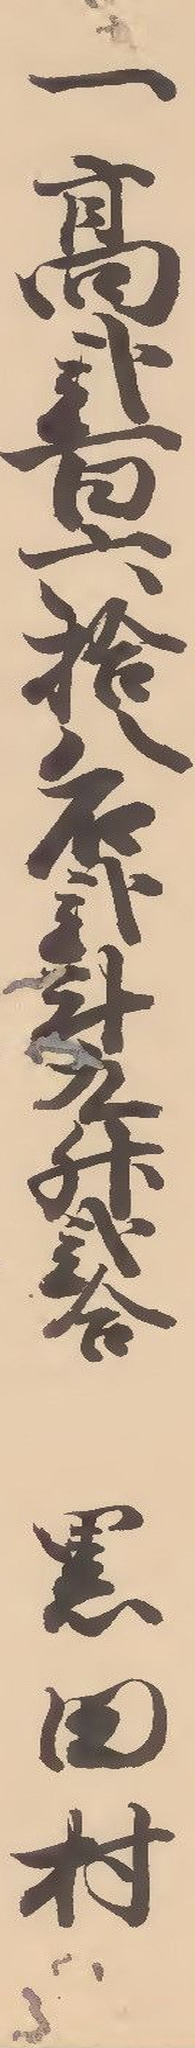一高弐百六拾八石弐斗九升弐合黒田村
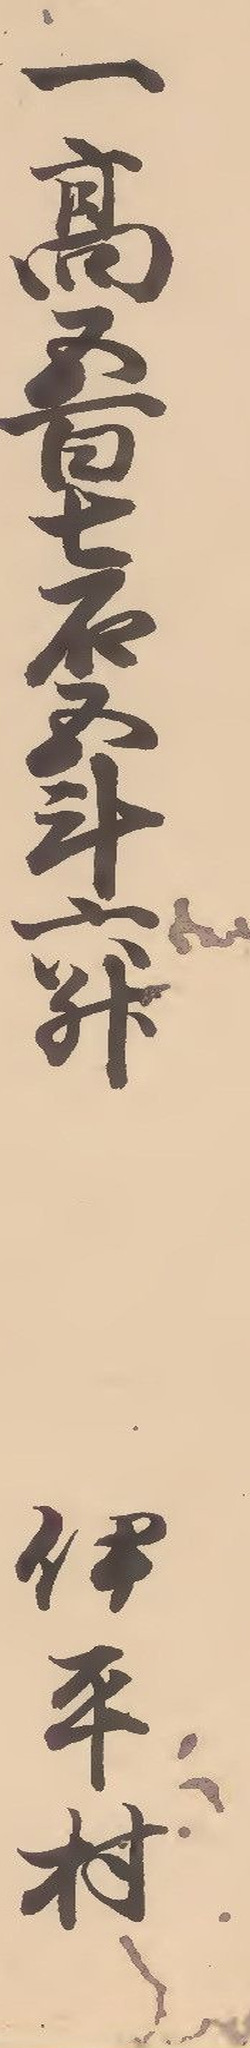一高五百七石五斗六升伊平村
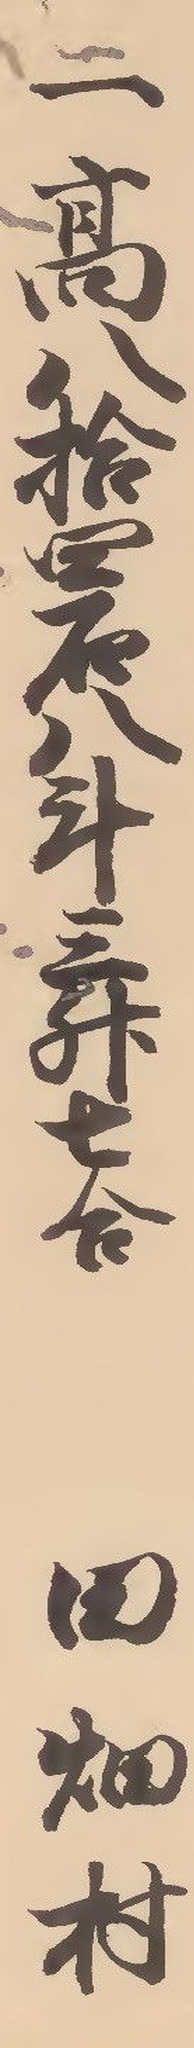二高八拾四石八斗三升七合田畑村

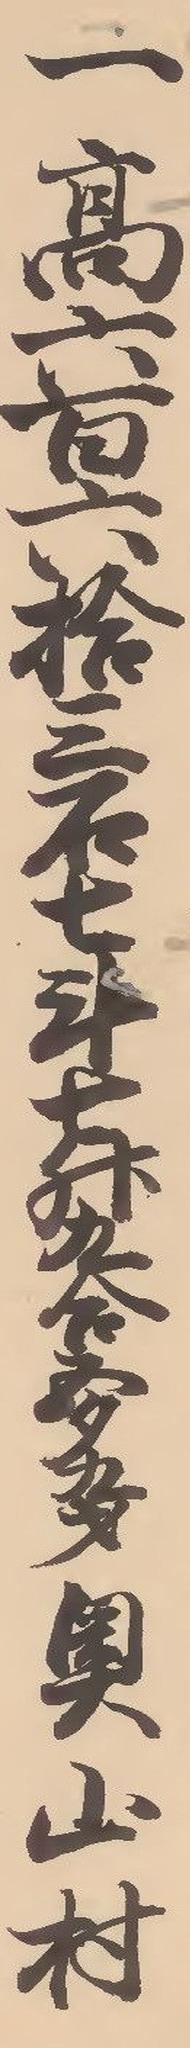一高六百六拾三石七斗七升九合五勺九才奥山村
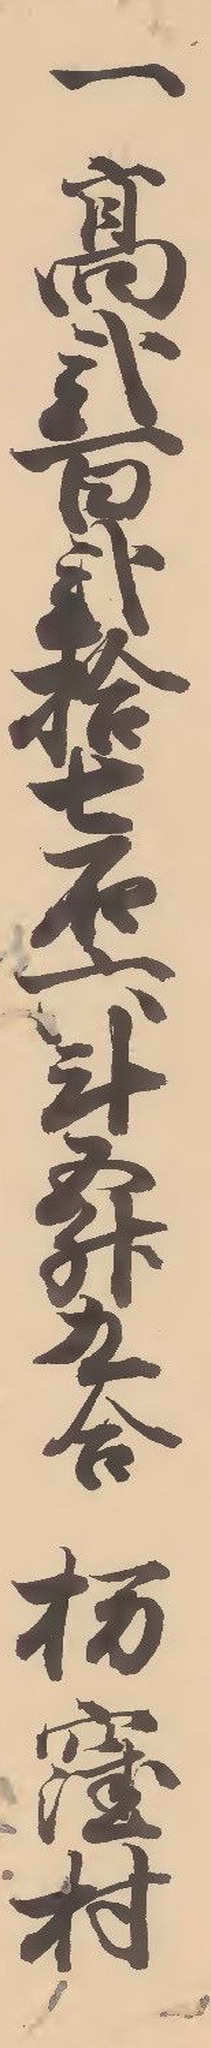一高弐百弐拾七石六斗五升九合栃窪村
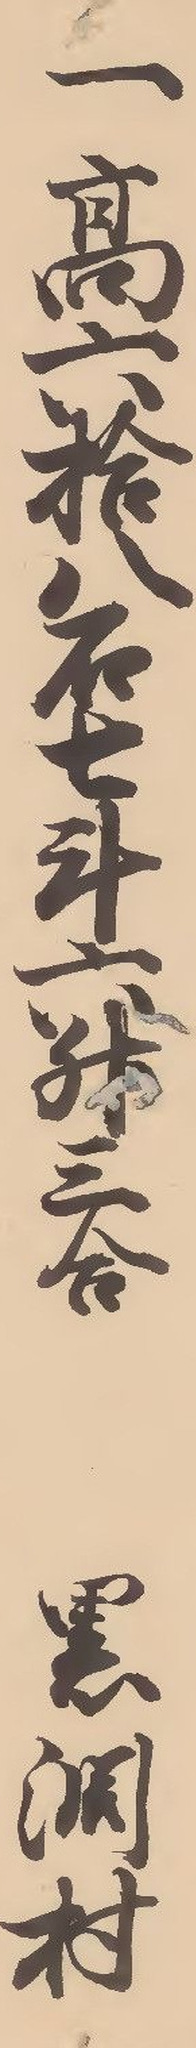一高六拾八石七斗六升三合黒渕村
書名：遠江国郷帳
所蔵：国立公文書館 National Archives of Japan
